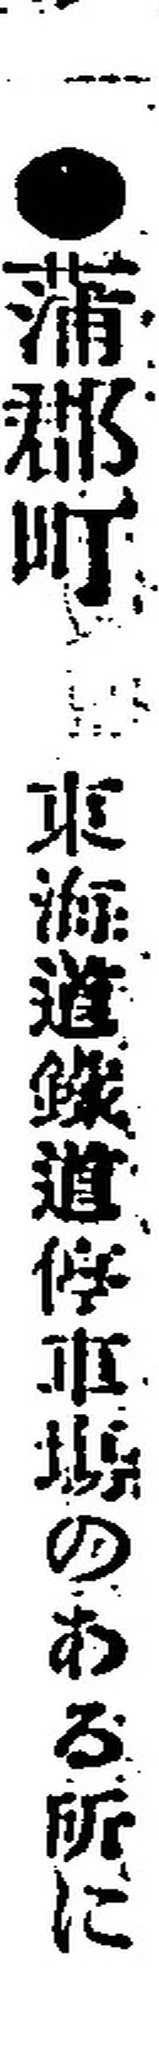●蒲郡町東海道鉄道停車場のある所に
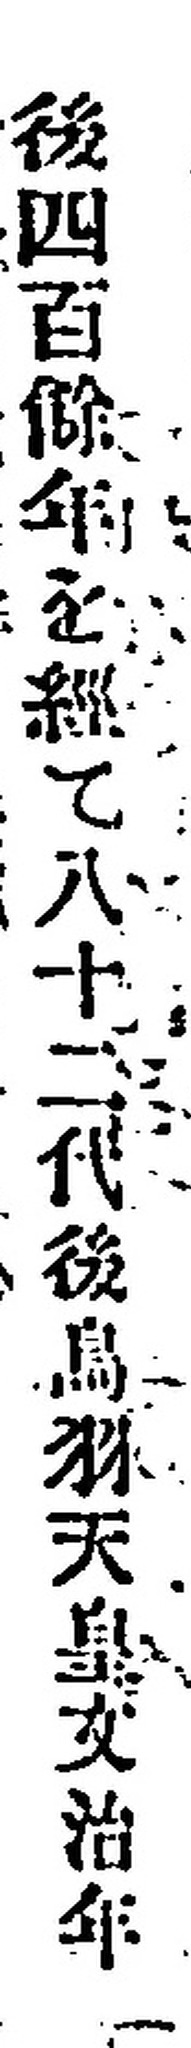後四百余年を経て八十二代後鳥羽天皇文治年
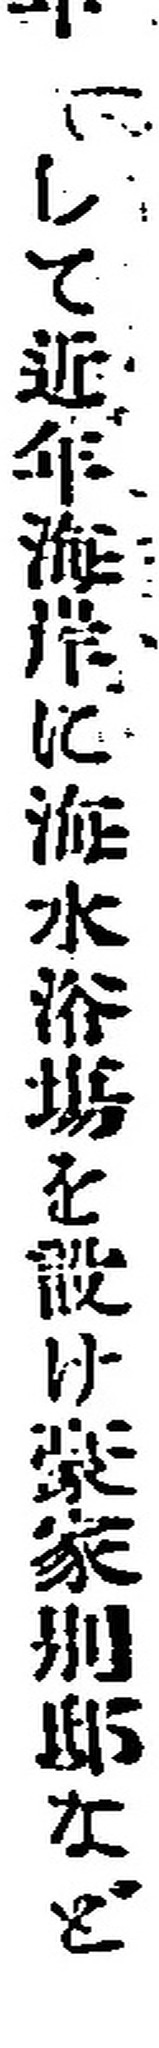して近年海岸に海水浴場を設け豪家別邸など
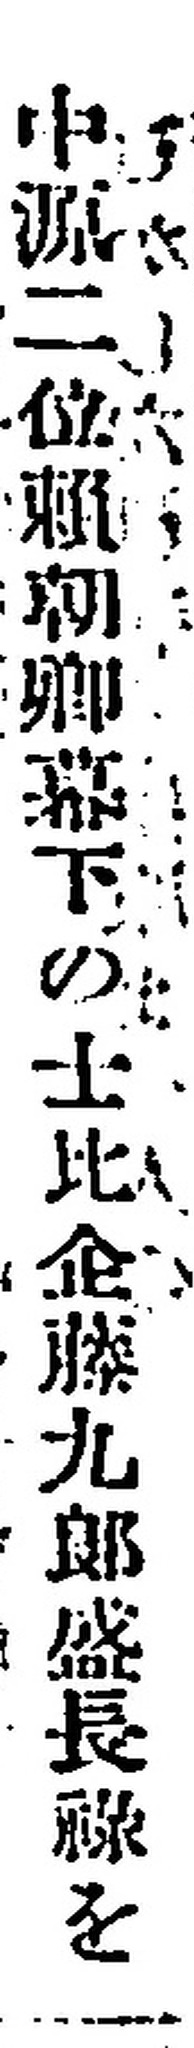中源二位頼朝卿幕下の士比企藤九郎盛長禄を
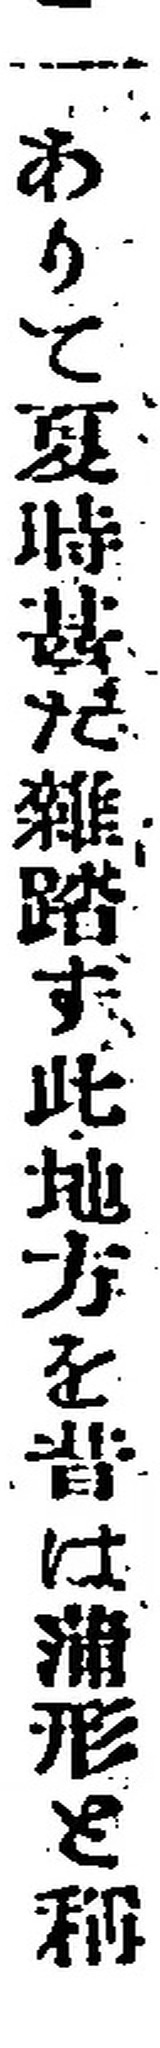ありて夏時甚だ雑踏す此地方を昔は蒲形と称
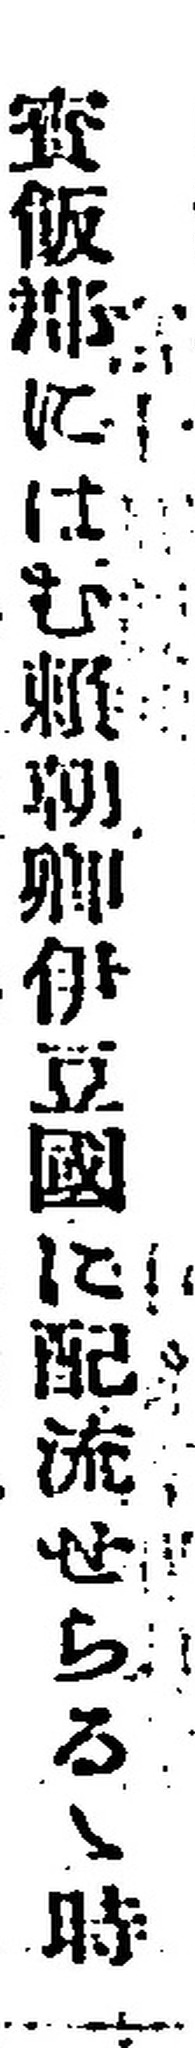宝飯郡にはむ頼朝卿伊豆国に配流せらるゝ時
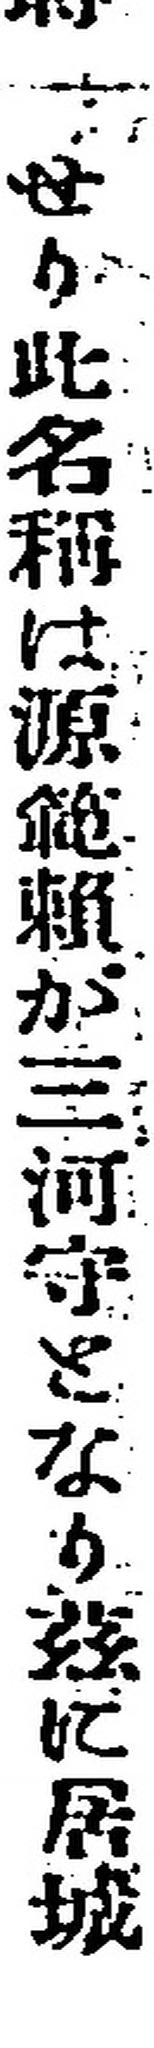せり此名称は源範頼が三河守となり茲に居城
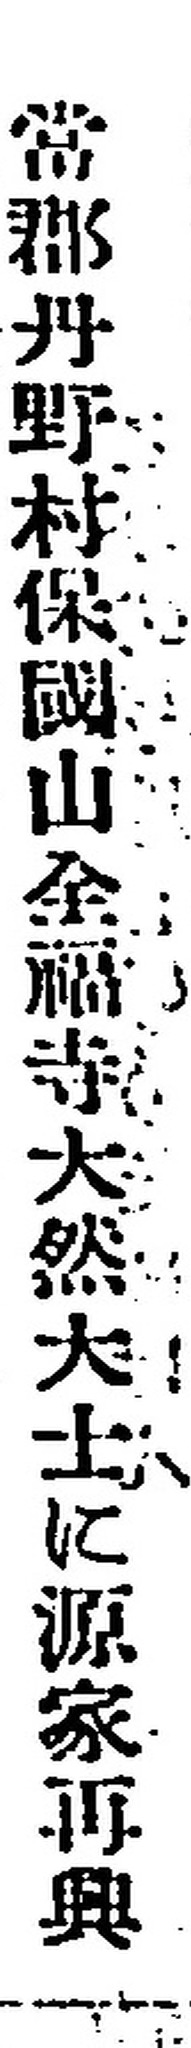当郡丹野村保国山全福寺大然大士に源家再興
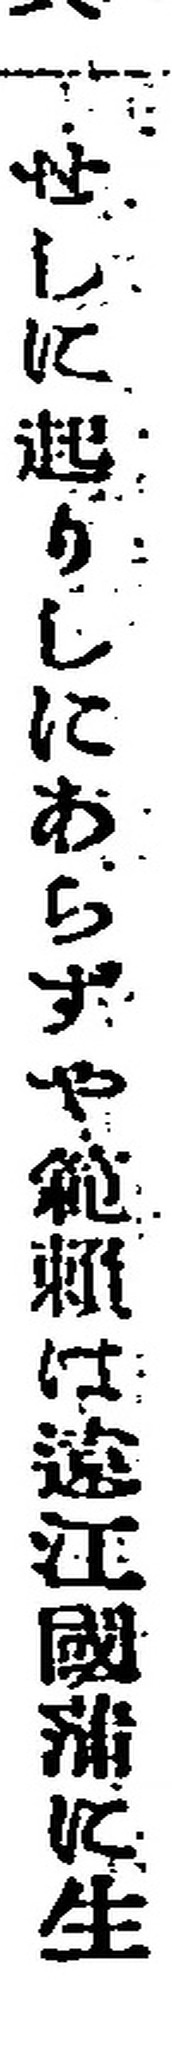せしに起りしにあらずや範頼は遠江国蒲に生
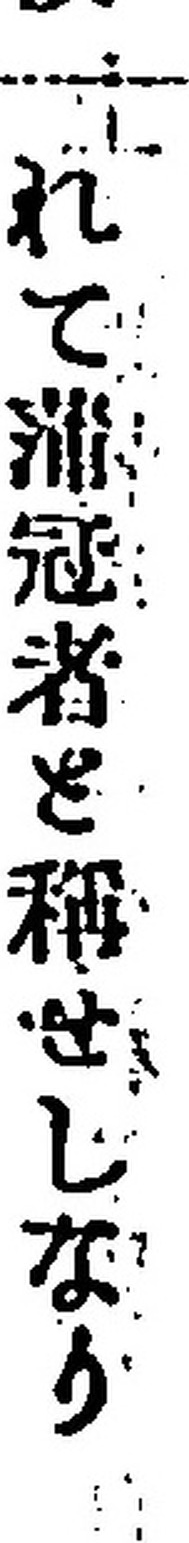れて蒲冠者と称せしなり
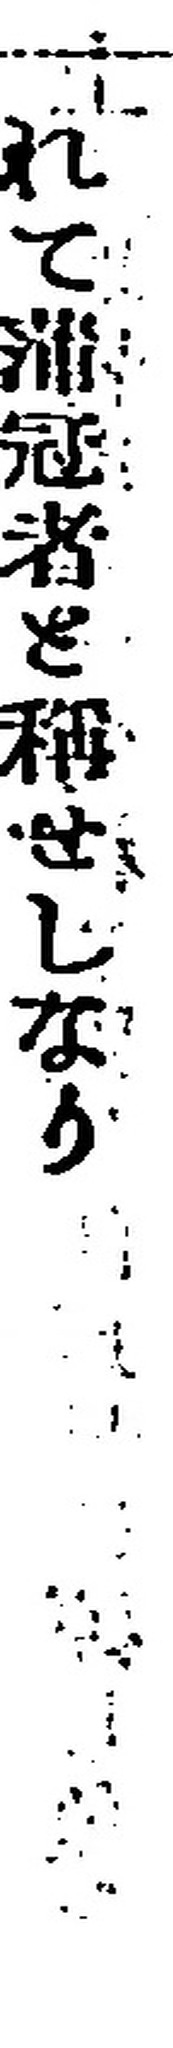れて蒲冠者と称せしなり
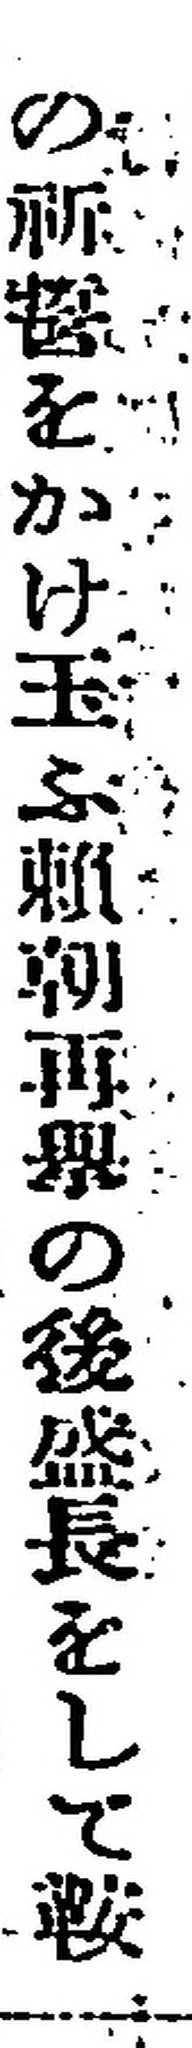の祈誓をかけ玉ふ頼朝再挙の後盛長をして鞍
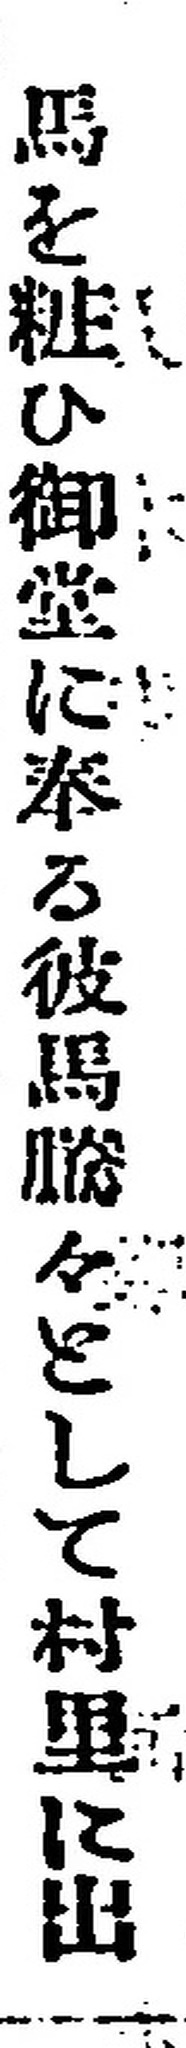馬を粧ひ御堂に奉る彼馬騰々として村里に出
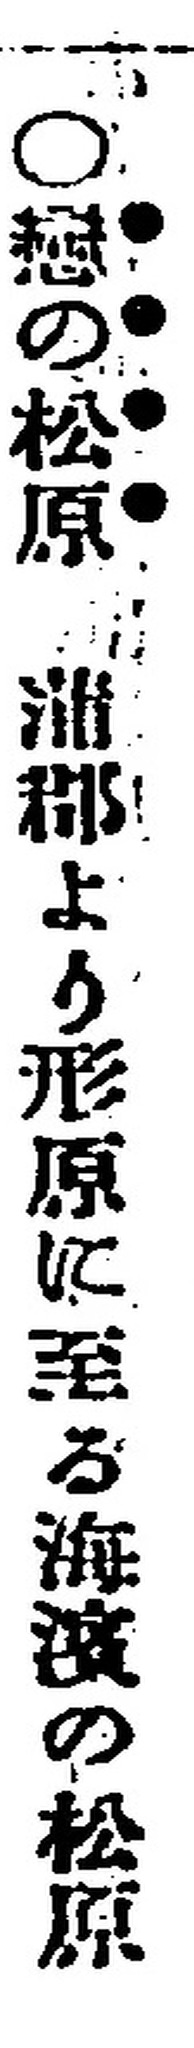○恋の松原蒲郡より形原に至る海浜の松原
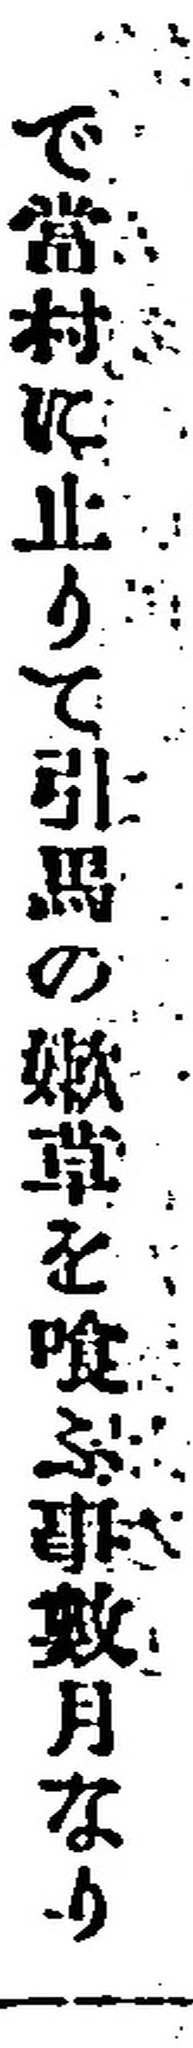で当村に止りて引馬の嫩草を喰ふ事数月なり
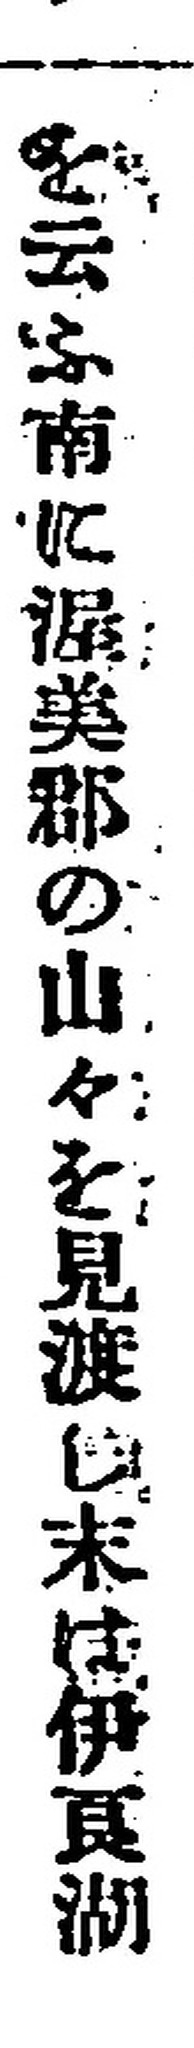を云ふ南に渥美郡の山々を見渡し末は伊良湖
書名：東参名勝案内
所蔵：国立国会図書館 National Diet Library, JAPAN
